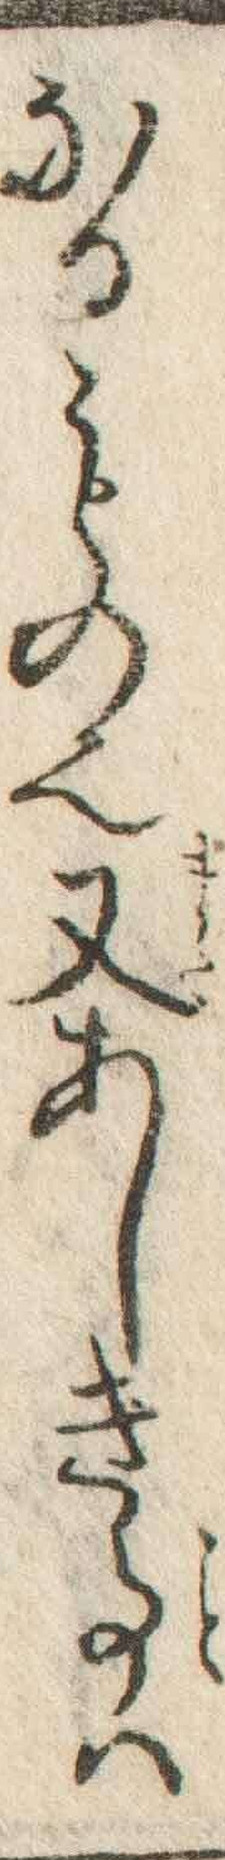なるもの也又あしき事は
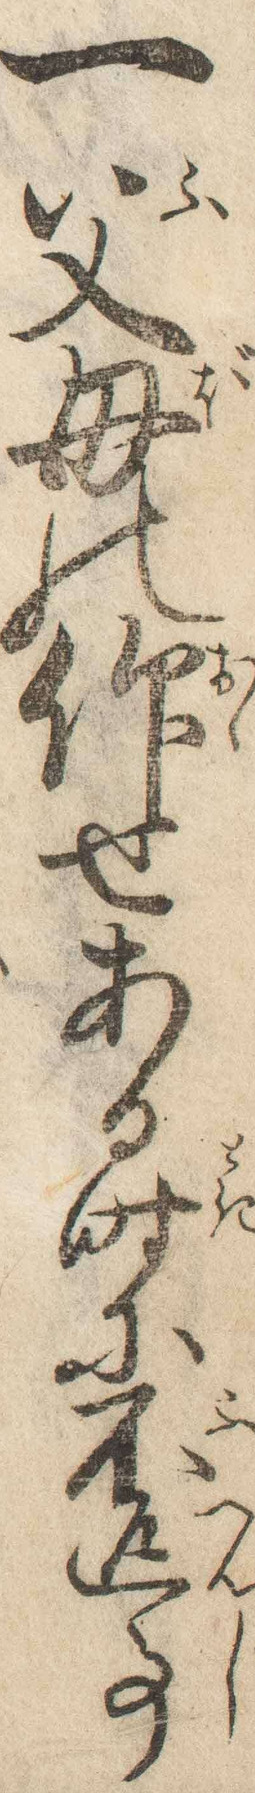一父母の仰せある時に不返事
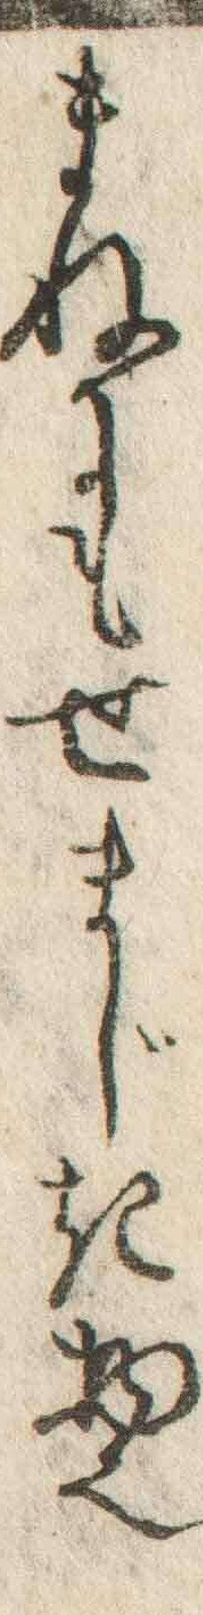まねにもせまじき物也
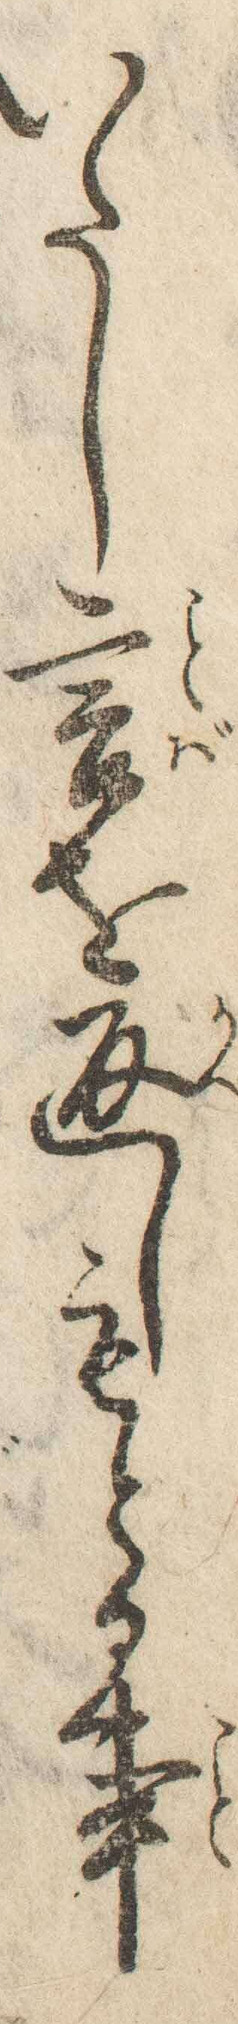いたし言を返しもとる事
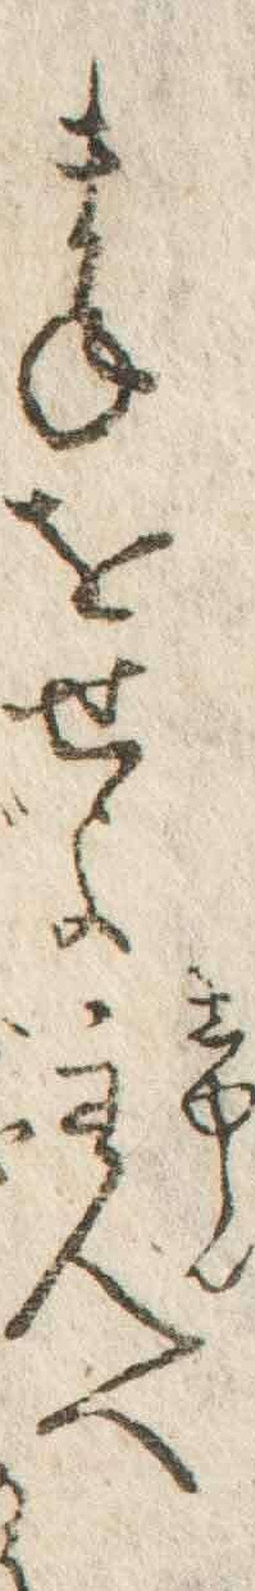まねをせよ主人へ
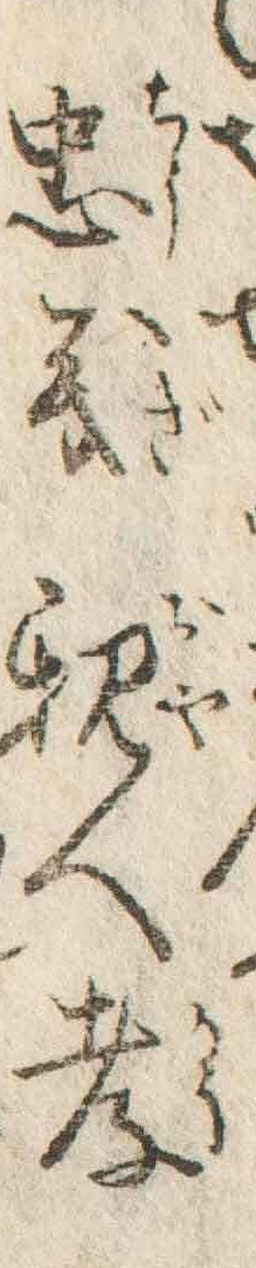忠義親へ孝
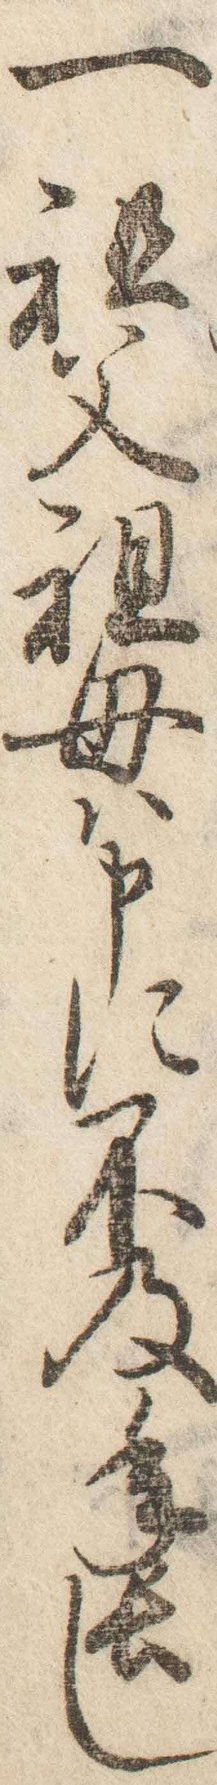一祖父祖母は申に不及年長し
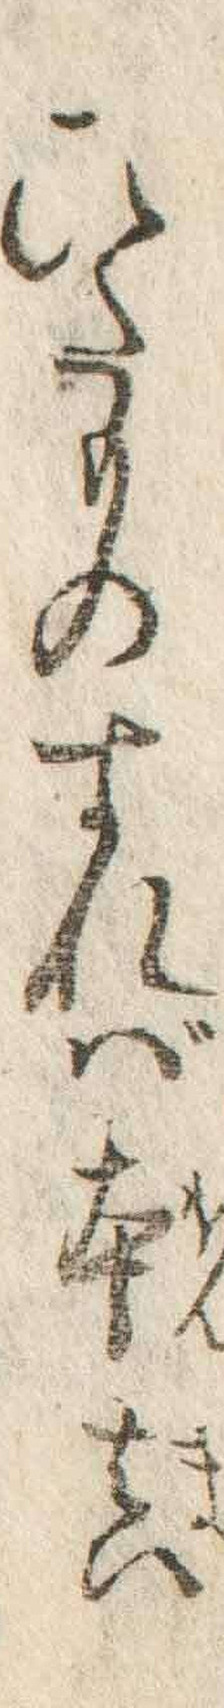ひたものすれば本真
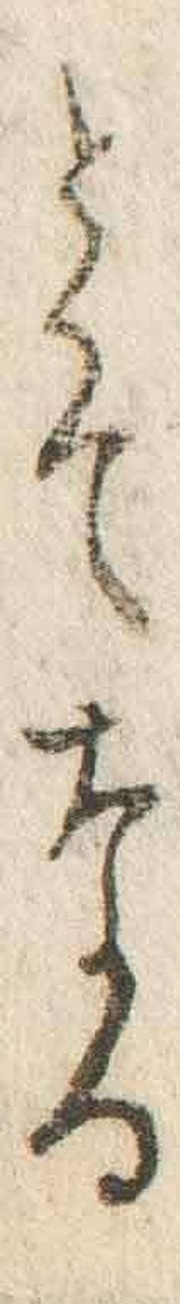とそなる
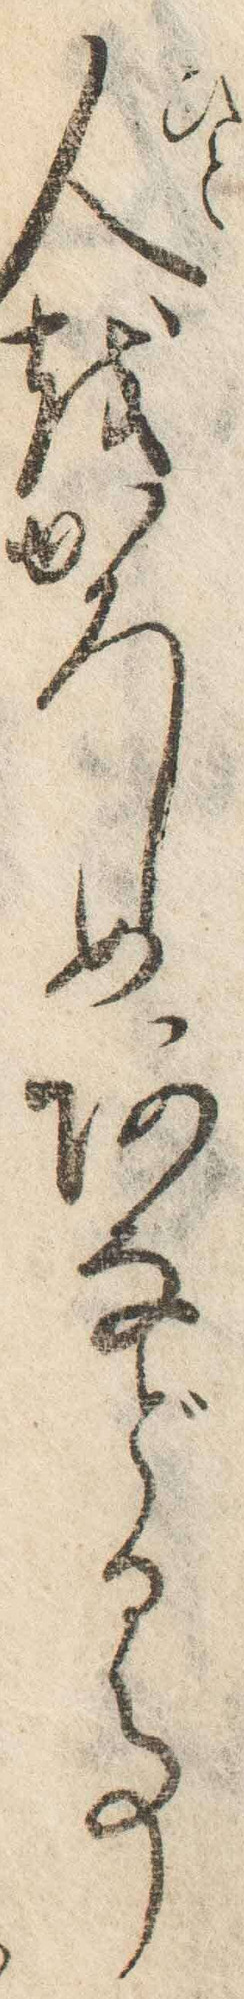人をかろしめあなどる事
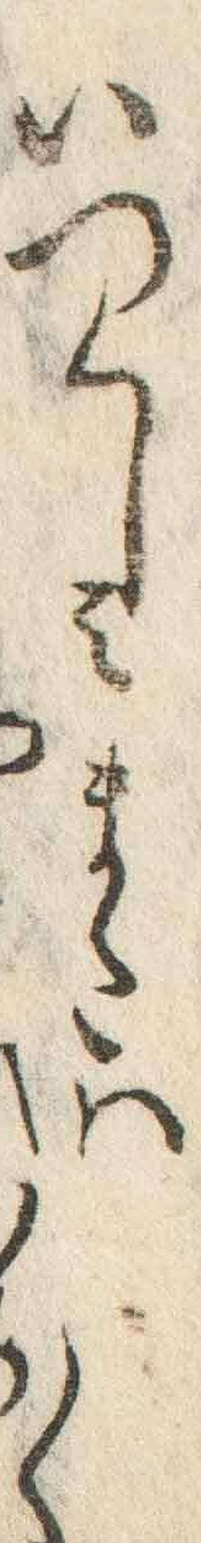いつくしみまたは
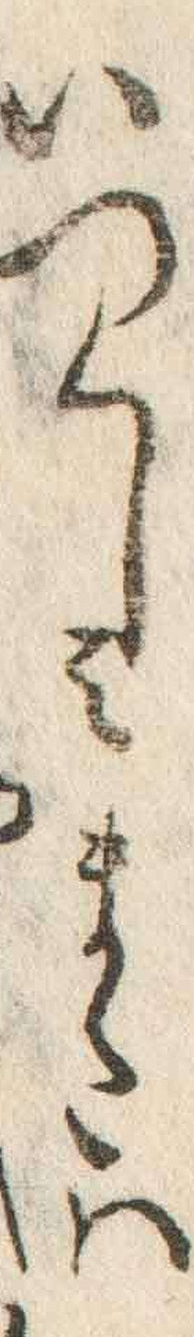いつくしみまたは
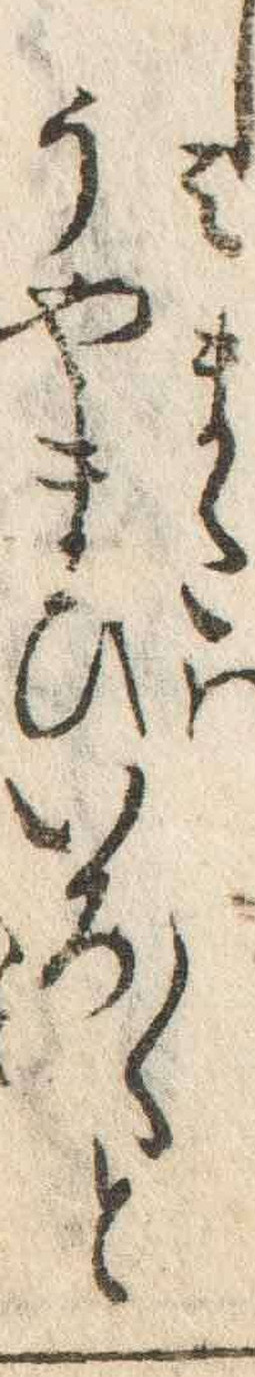うやまひいろ〳〵と
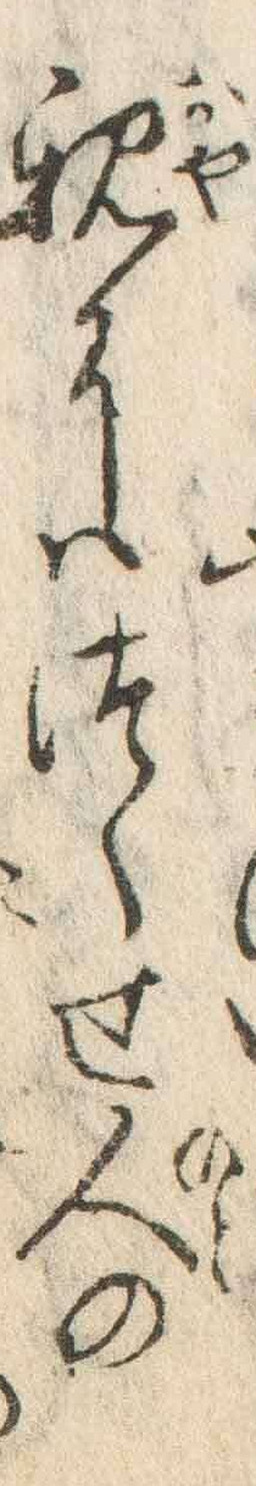親にはつくせ人の
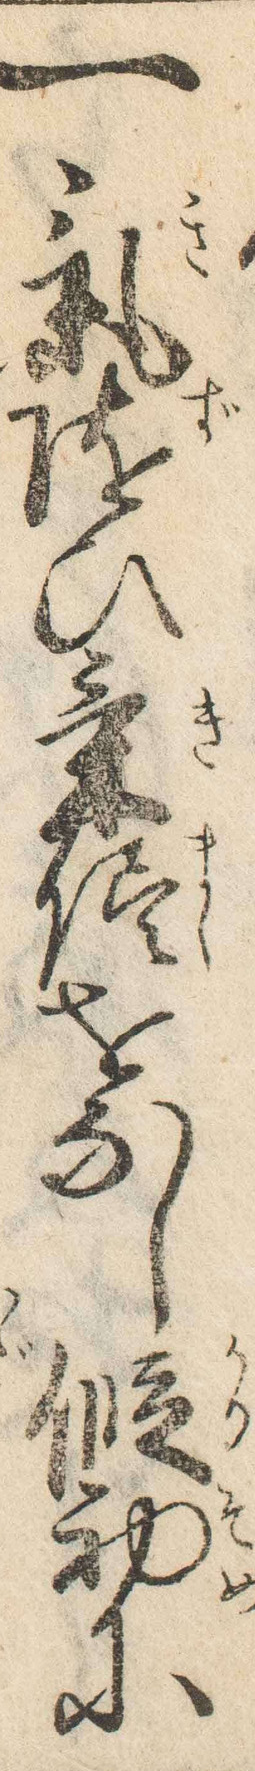一気随ひ気侭をなし假初に
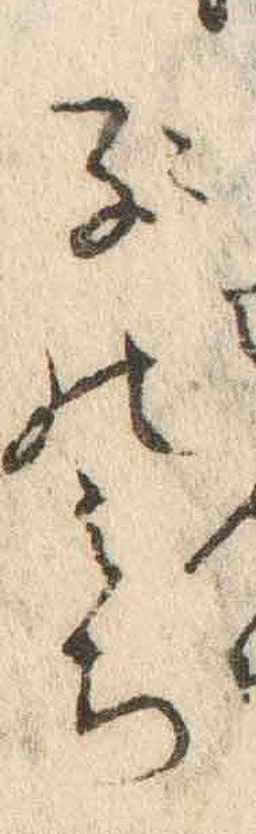子のみち
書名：撫育草
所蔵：東京学芸大学附属図書館 国文学研究資料館
